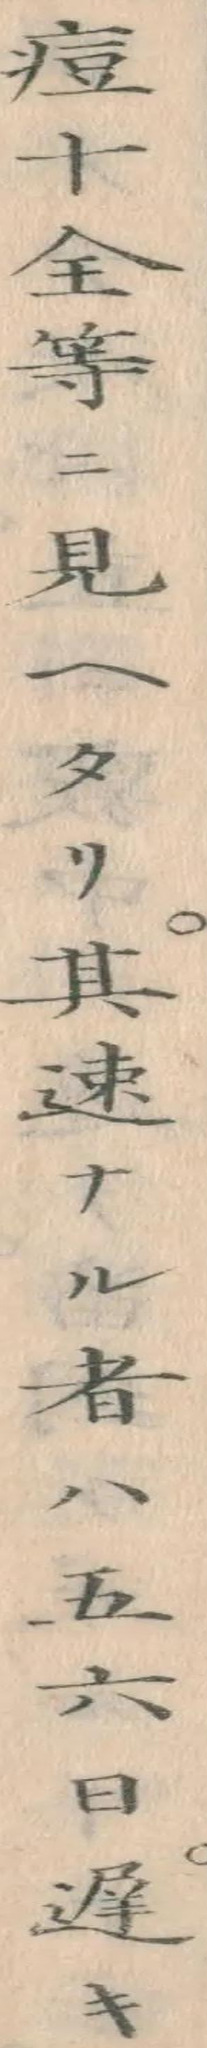痘十全等ニ見ヘタリ。其速ナル者ハ五六日。遅キ
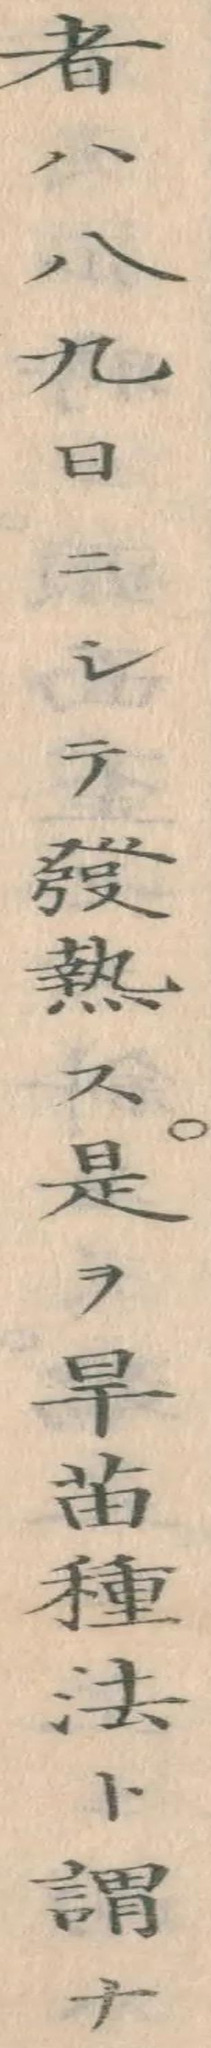者ハ八九日ニシテ発熱ス。是ヲ早苗種法ト謂ナ
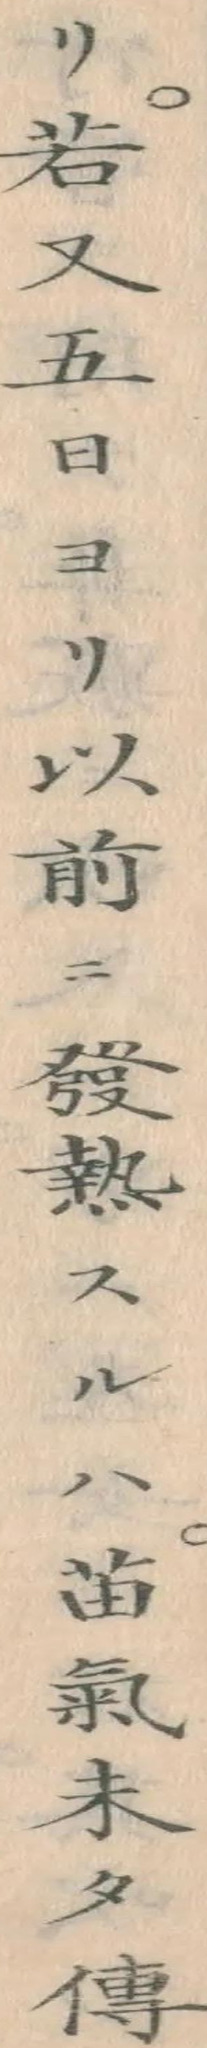リ。若又五日ヨリ以前ニ発熱スルハ。苗気未タ伝
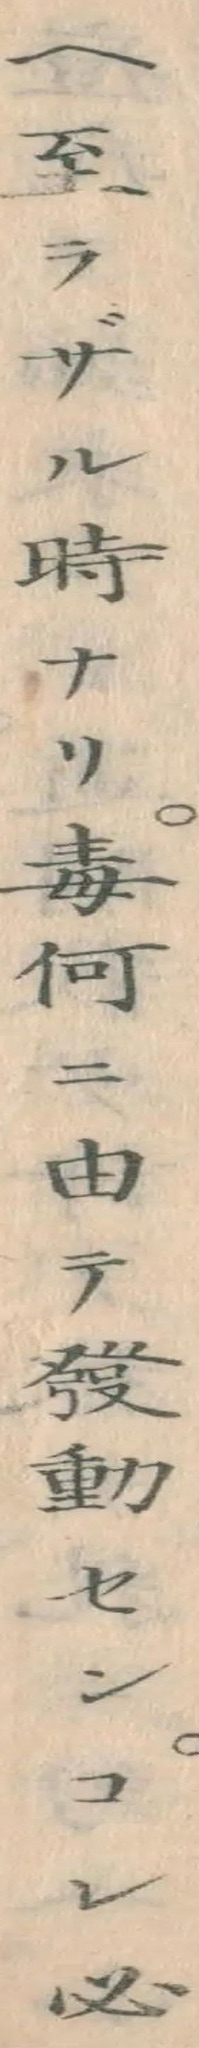ヘ至ラザル時ナリ。毒何ニ由テ発動セン。コレ必
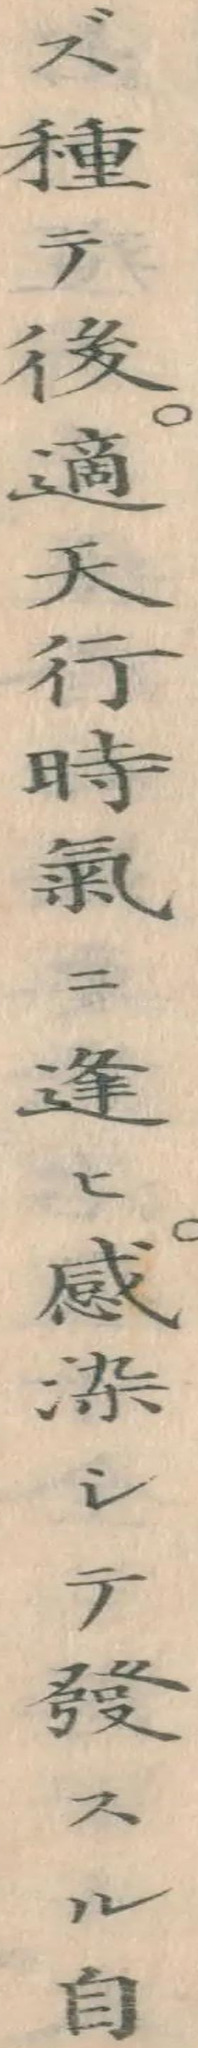ズ種テ後。適天行時気ニ逢ヒ。感染シテ発スル自

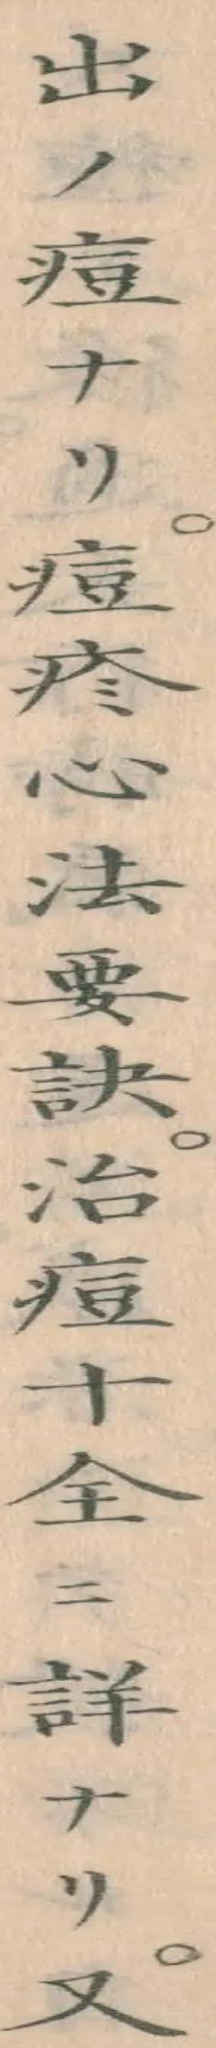出ノ痘ナリ。痘疹心法要訣。治痘十全ニ詳ナリ。又
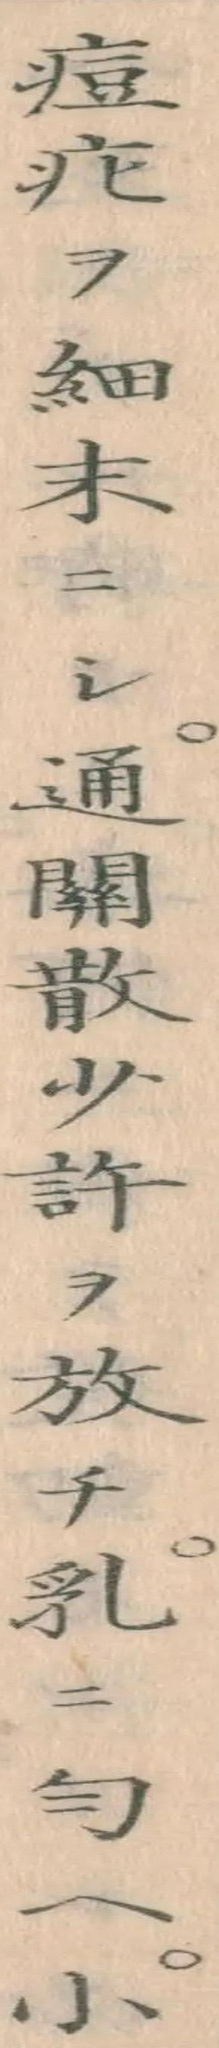痘疕ヲ細末ニシ。通関散少許ヲ放チ。乳ニ匀ヘ。小
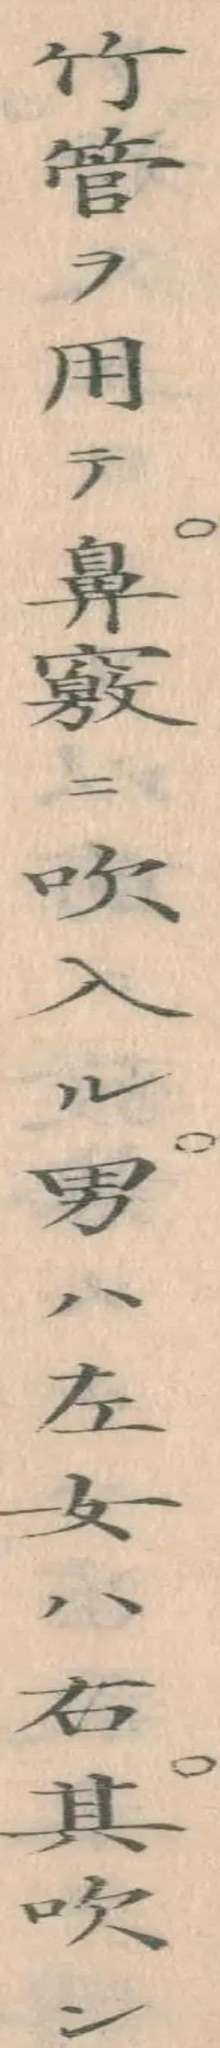竹管ヲ用テ。鼻竅ニ吹入ル。男ハ左女ハ右。其吹ン
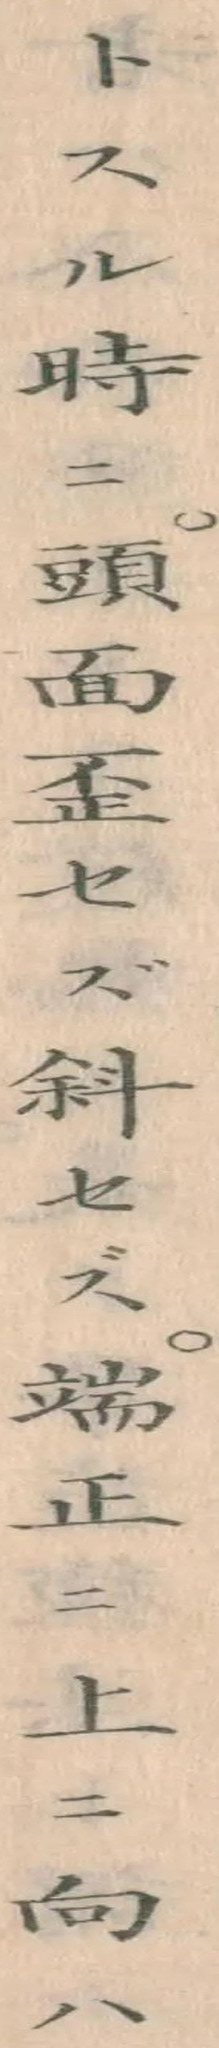トスル時ニ。頭面歪セズ斜セズ。端正ニ上ニ向ハ
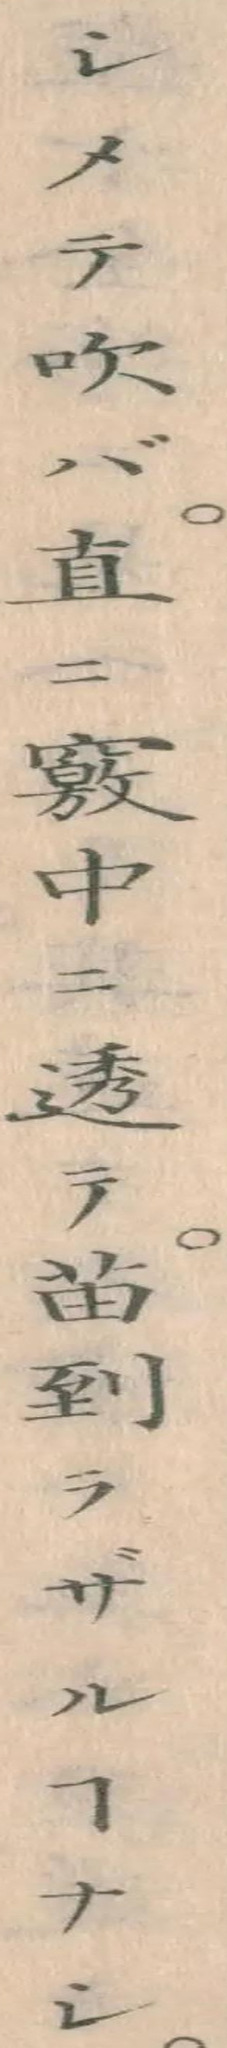シメテ吹バ。直ニ竅中にニ透テ。苗到ラザルヿナシ。
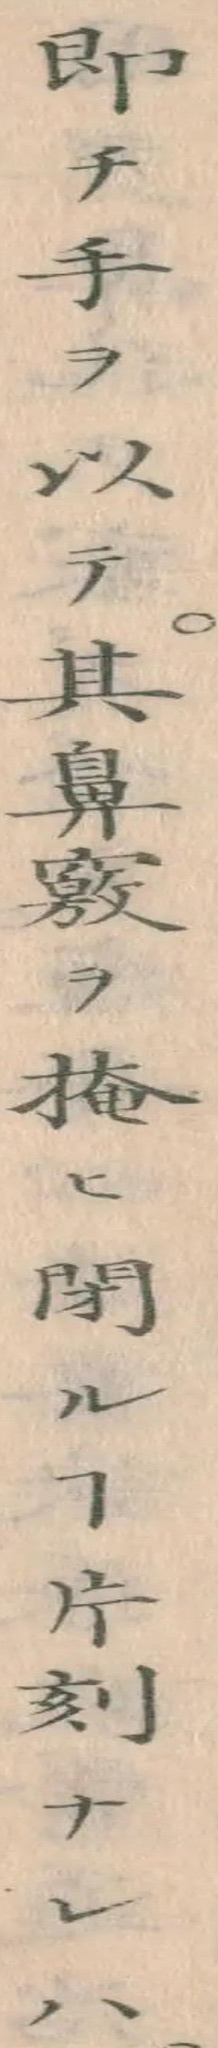即チ手ヲ以テ。其鼻竅ヲ掩ヒ閉ルヿ片刻ナレハ。
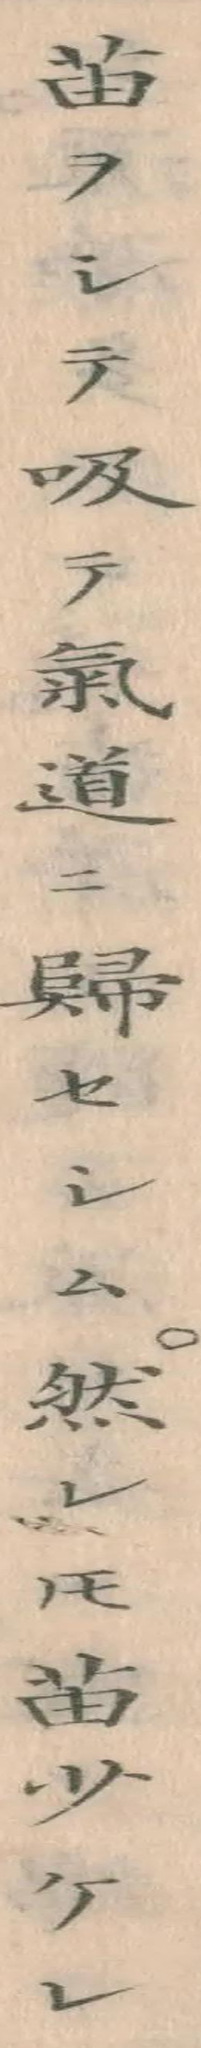苗ヲシテ吸テ気道ニ帰セシム。然レ𪜈苗少ケレ
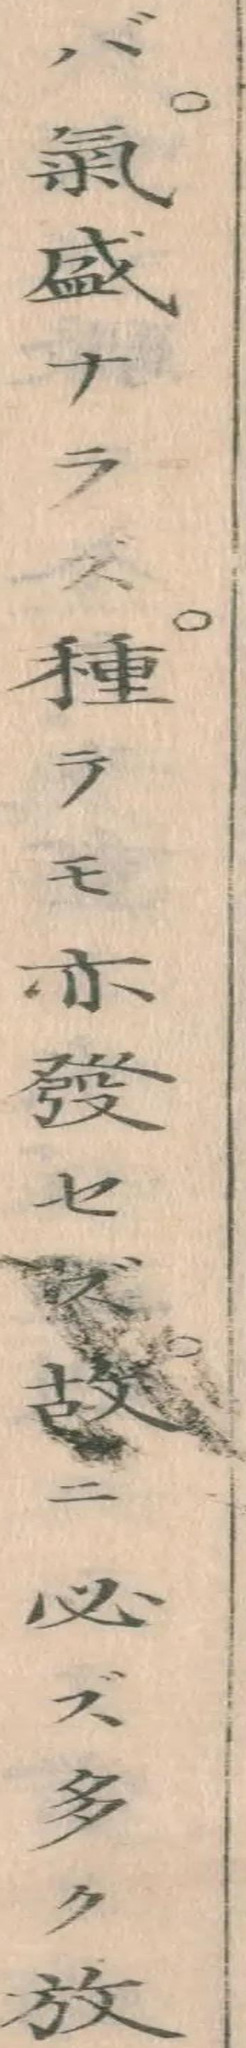バ。気盛ナラズ。種テモ亦発セズ。故ニ必ズ多ク放
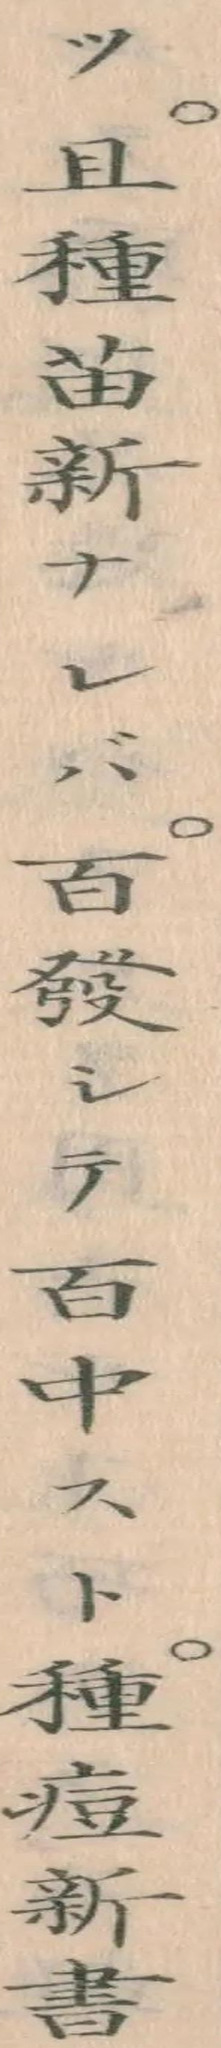ツ。且種苗新ナレバ。百発シテ百中スト。種痘新書
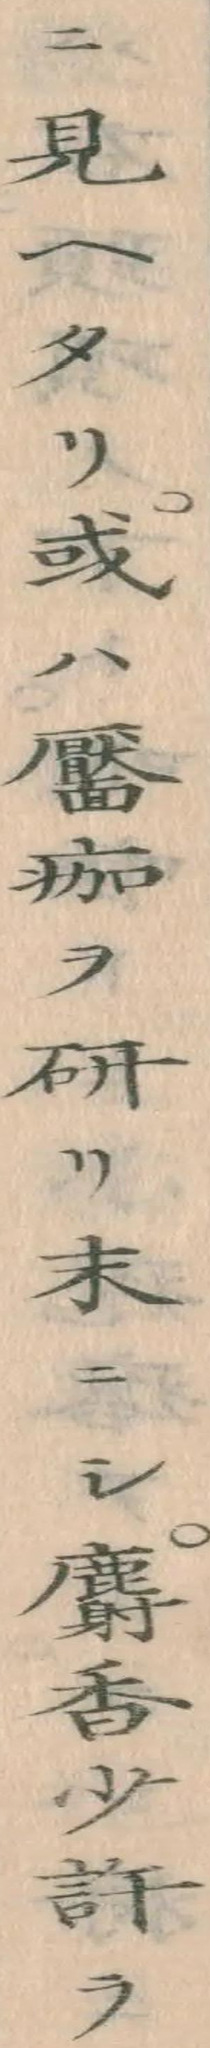ニ見ヘタリ。或ハ靨痂ヲ研リ末ニシ。麝香少許ヲ
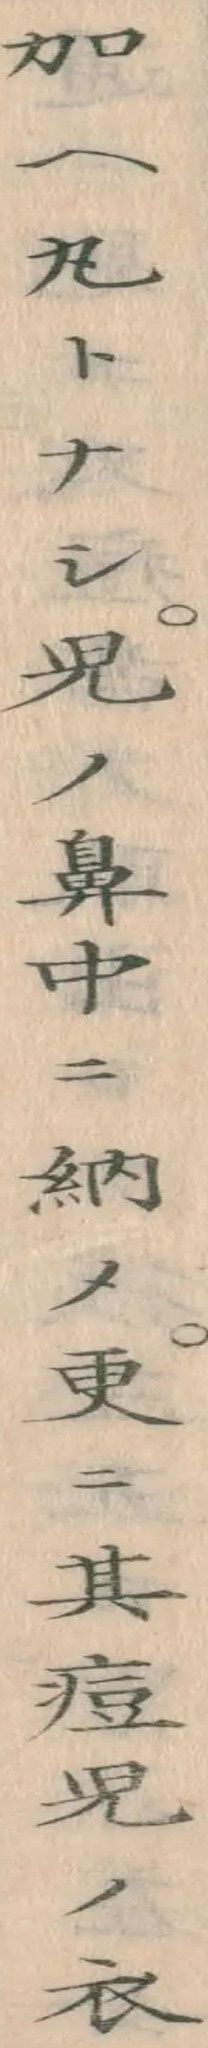加ヘ丸トナシ。児ノ鼻中ニ納メ。更ニ其痘児ノ衣
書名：種痘弁義
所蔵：国立国会図書館 National Diet Library, JAPAN
